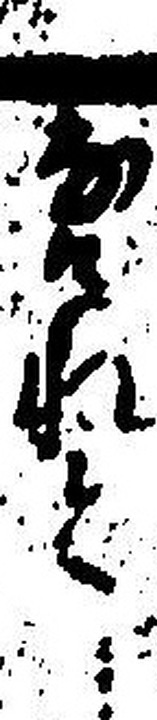なけれと
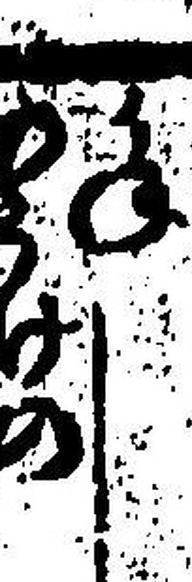もうけの
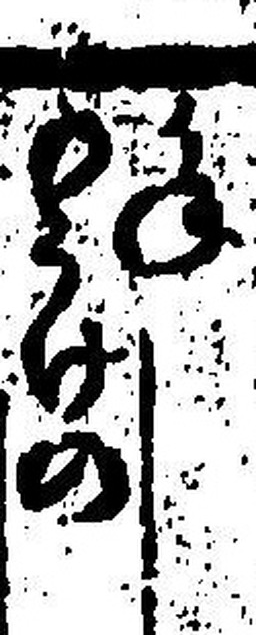もうけの
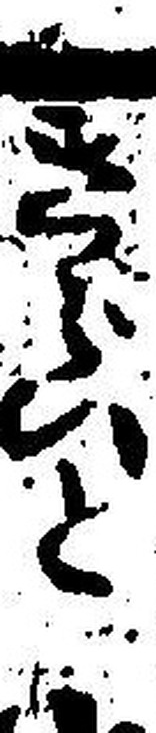きらいと
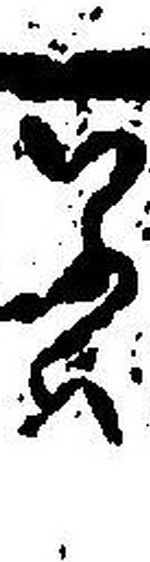いふは
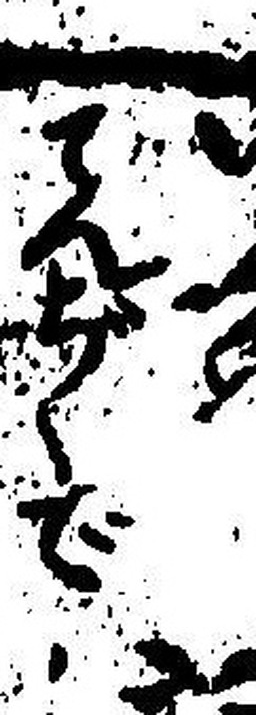てんぢくで
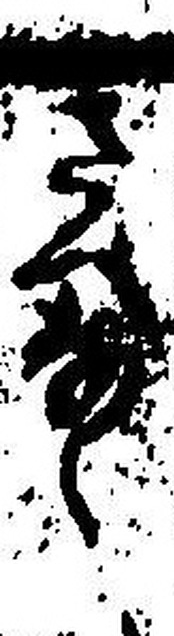さへなく
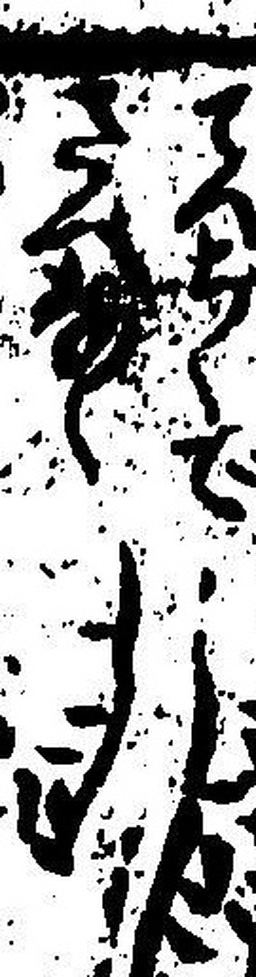さへなく
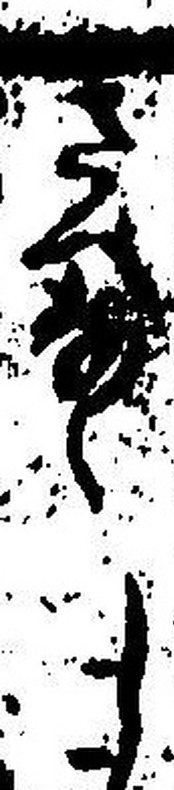さへなく
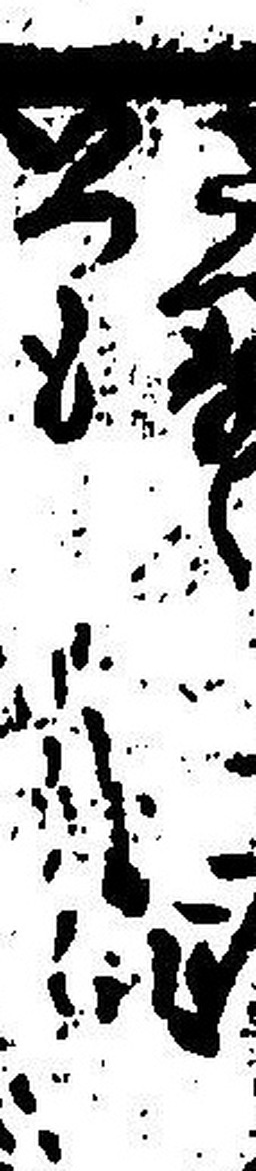いつも
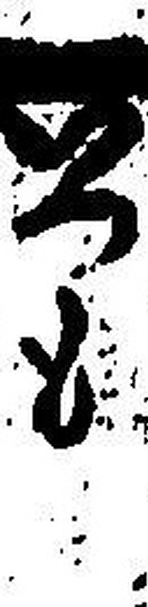いつも
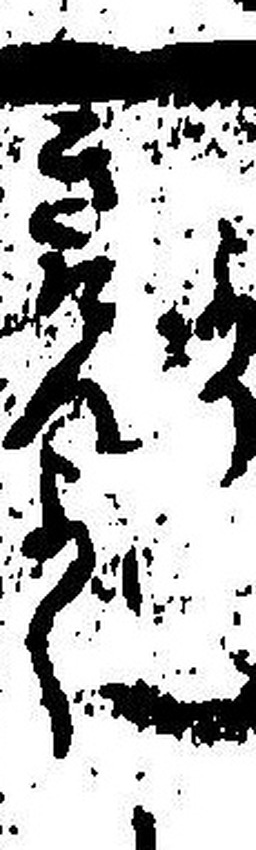きけんよく
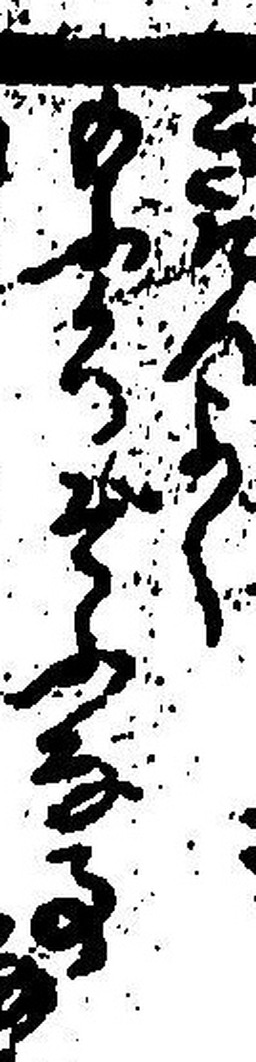もふかりそふな事なら
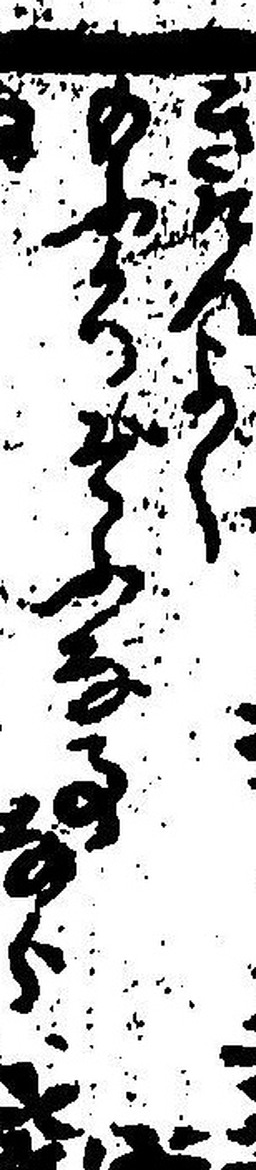もふかりそふな事なら
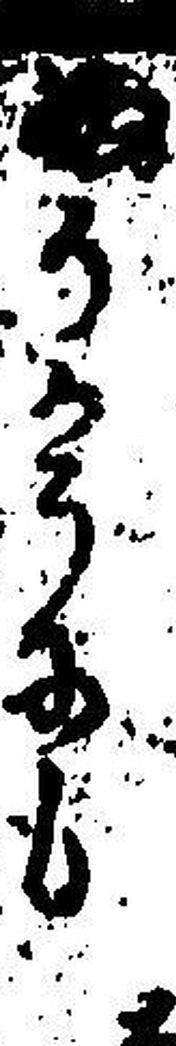ふうかうにも
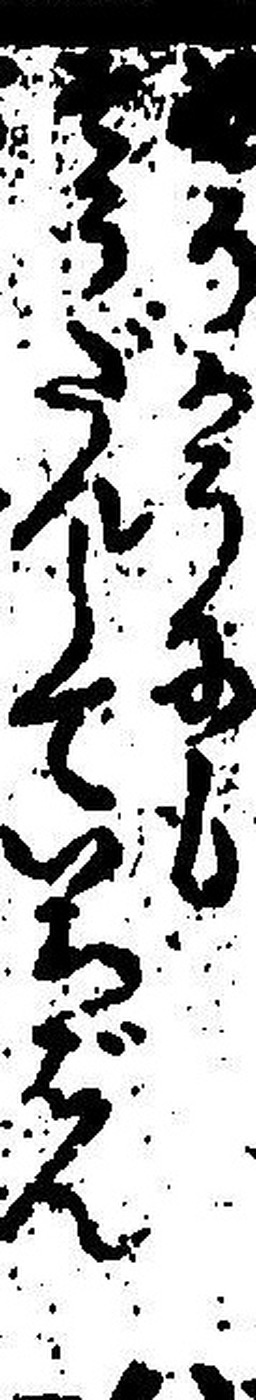そうだんしていちばん
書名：天竺儲之筋 / 市場通笑作
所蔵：東京大学総合図書館 General Library in the University of Tokyo, JAPAN
